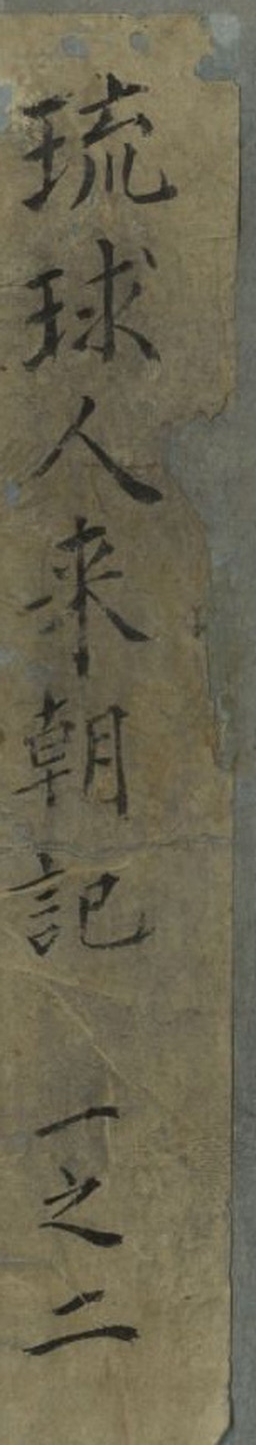琉球人来朝記一之二

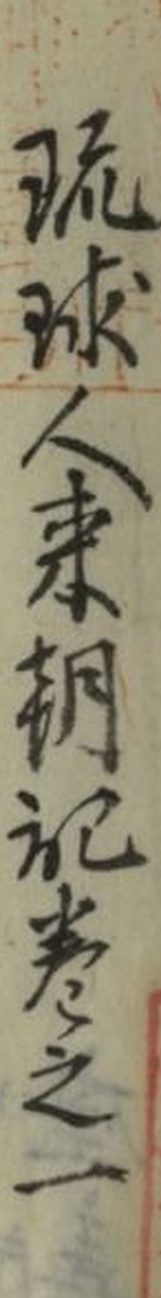琉球人来朝記巻之一
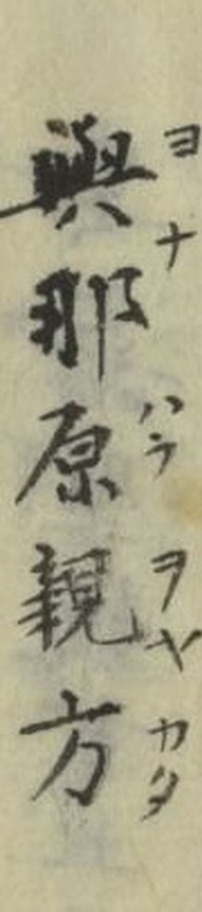副使与那原親方

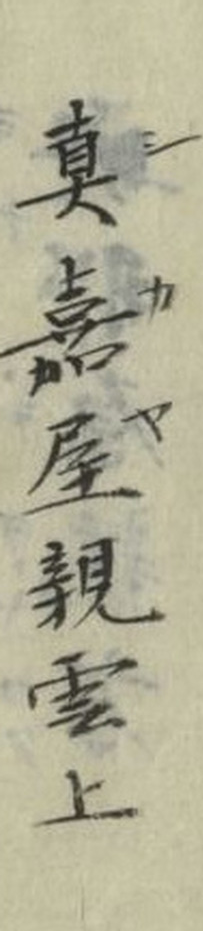師真嘉屋親雲上
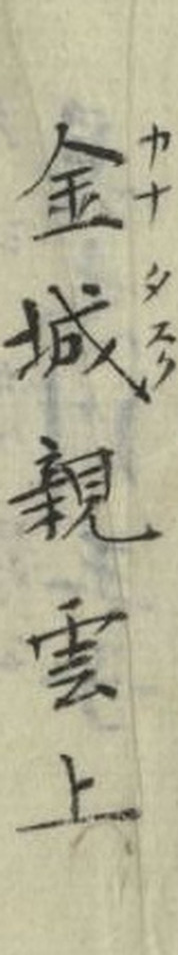使賛金城親雲上
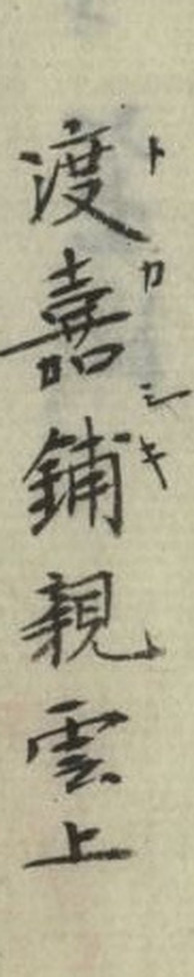渡嘉鋪親雲上
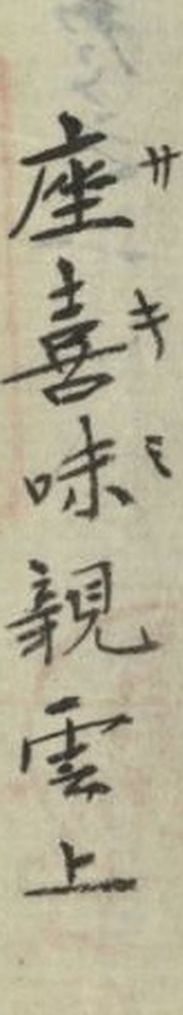座喜味親雲上
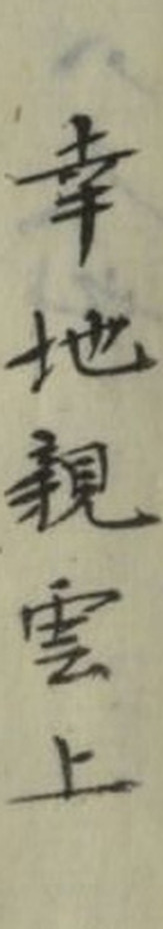幸地親雲上
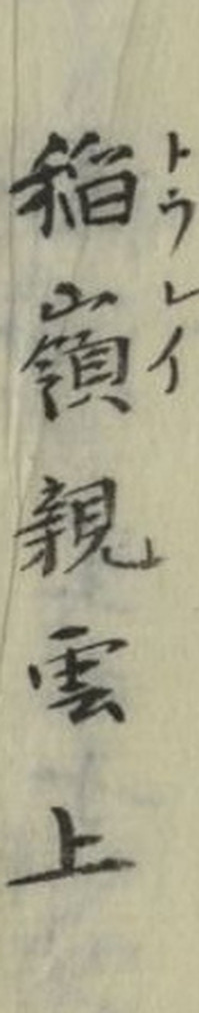稲嶺親雲上
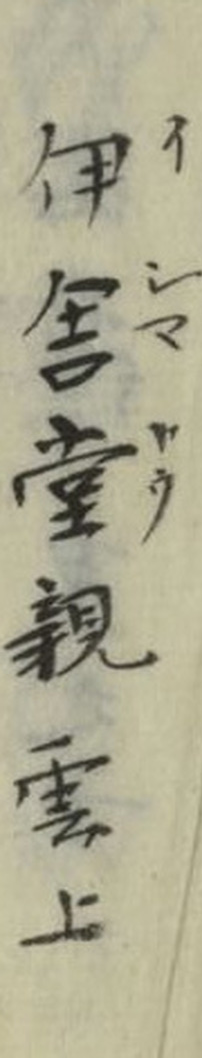伊舎堂親雲上
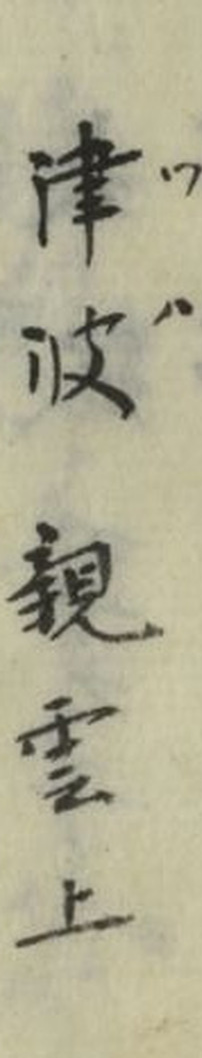津波親雲上

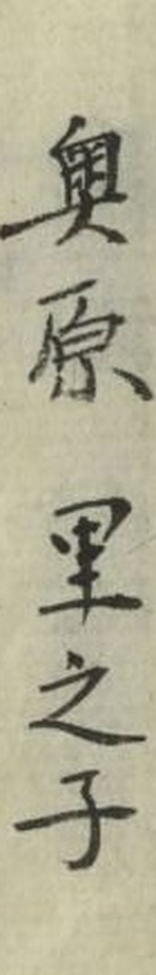奥原里之子
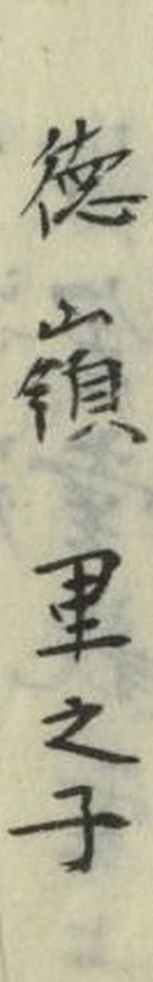徳嶺里之子
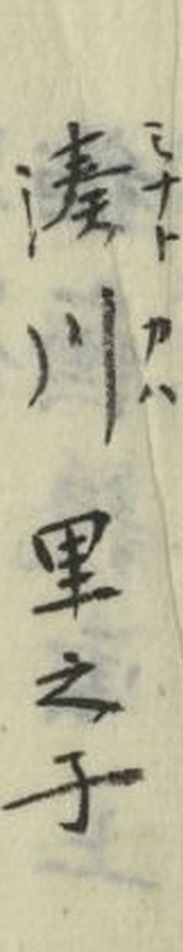湊川里之子
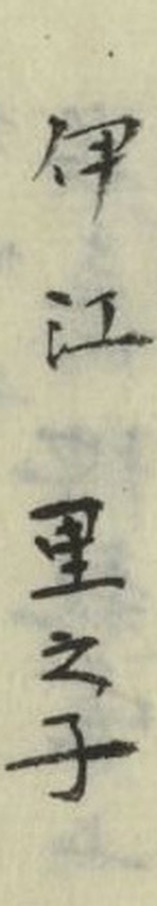伊江里之子
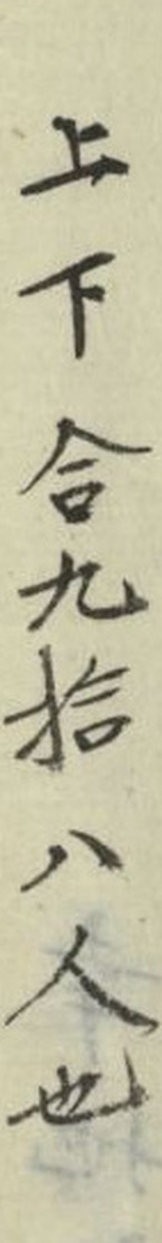上下合九拾八人也
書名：琉球人来朝記 一之二
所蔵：University of the Ryukyus Library
